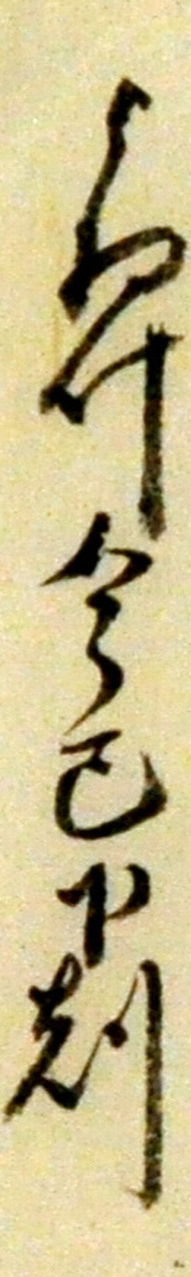被為叶今巳下刻
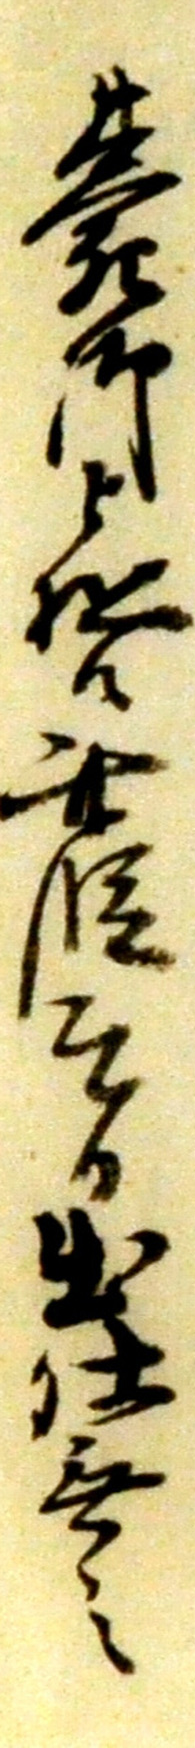薨御被遊候此段今日出仕無之

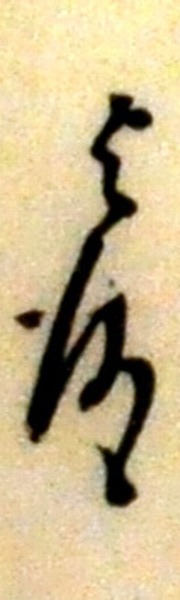与致候
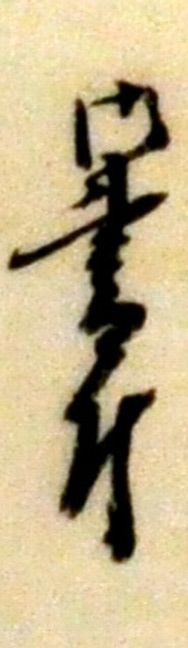御書付
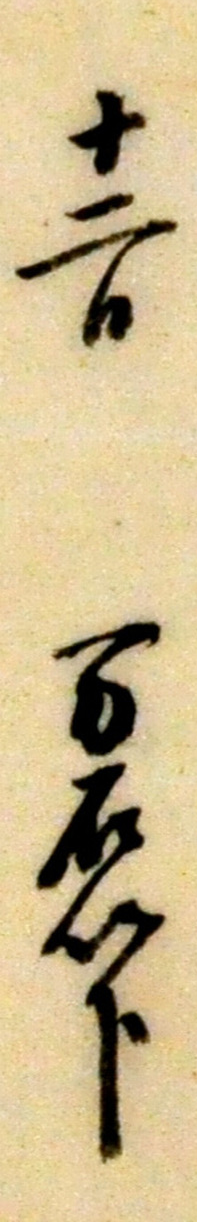十二日万石以下
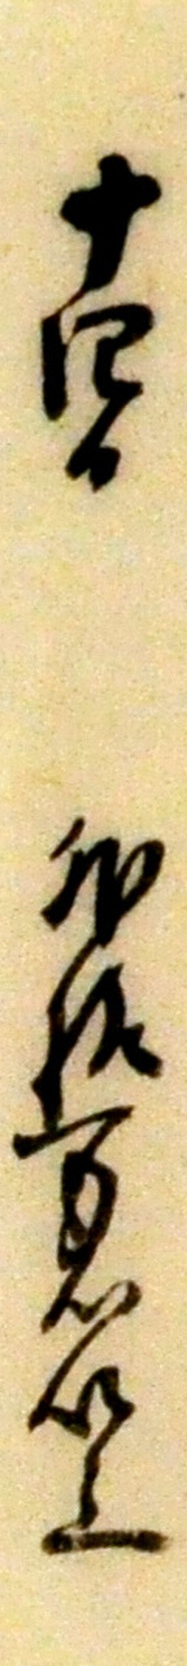十四日外様万石以上
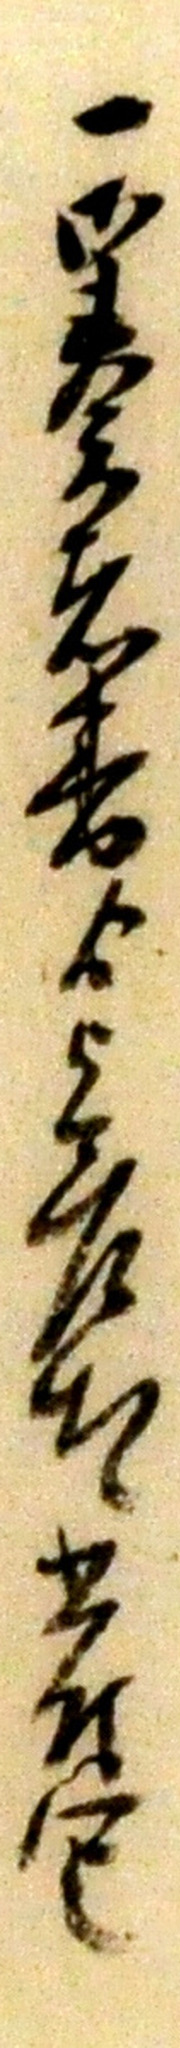一御奏者番ゟ被差出候所書付写
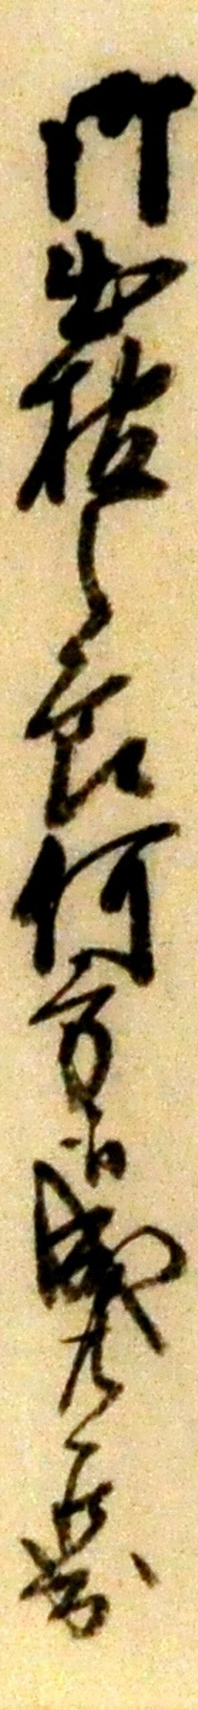御出棺之節何方江成共罷出
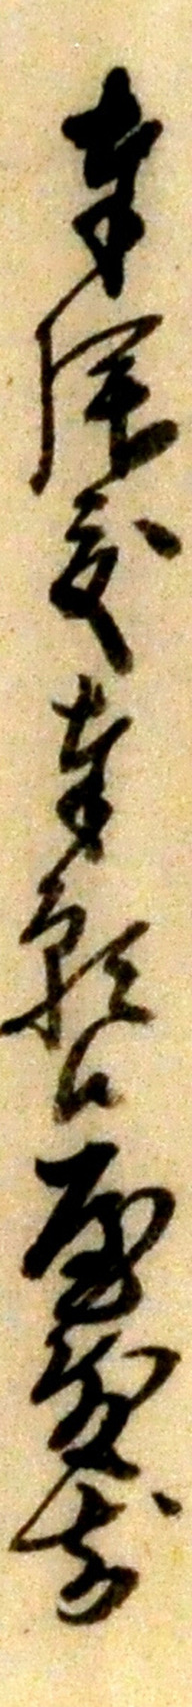奉拝度奉願候屋敷前
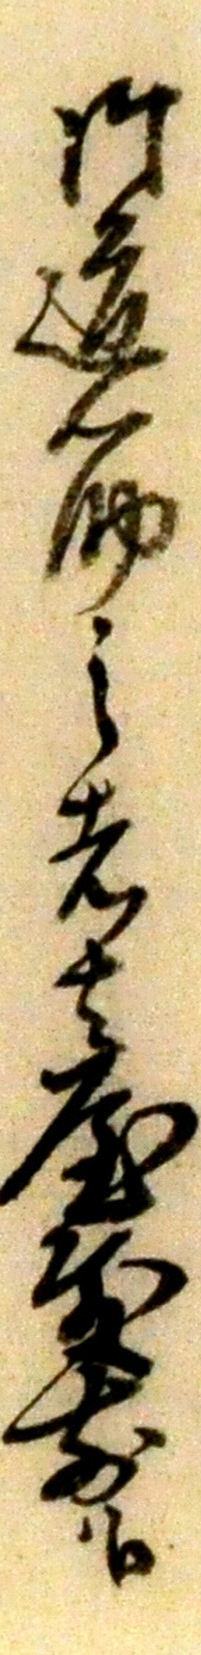御道筋之者者屋敷前江
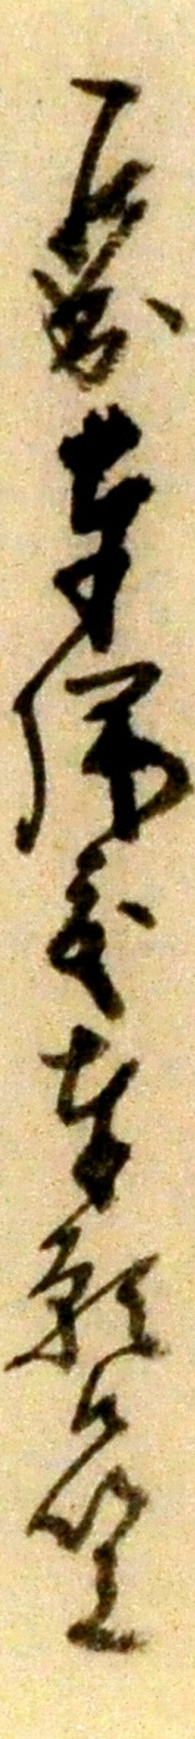罷出奉拝度奉願候以上
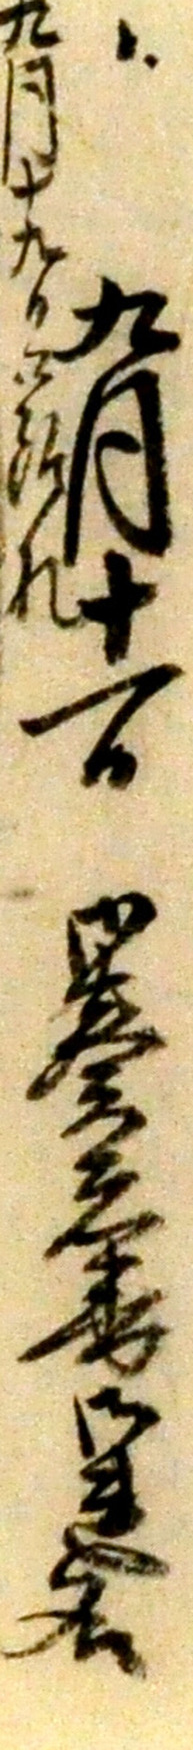九月十一日御奏者番御連名
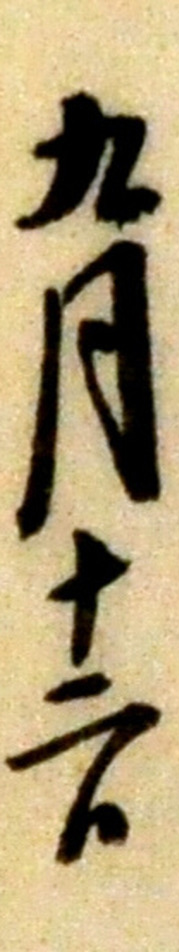九月十二日
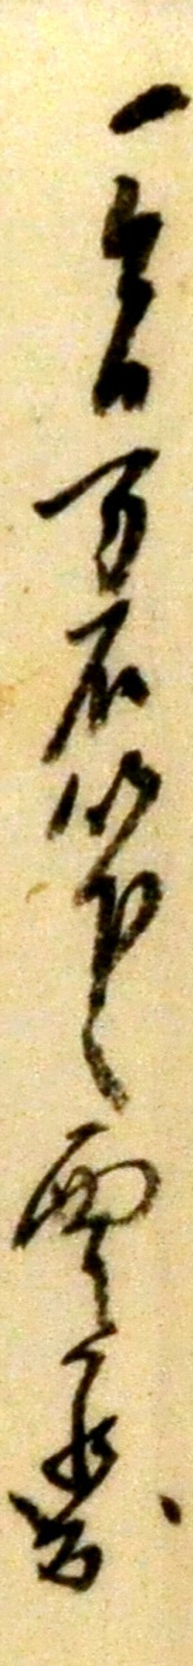一今日万石以下之面々罷出
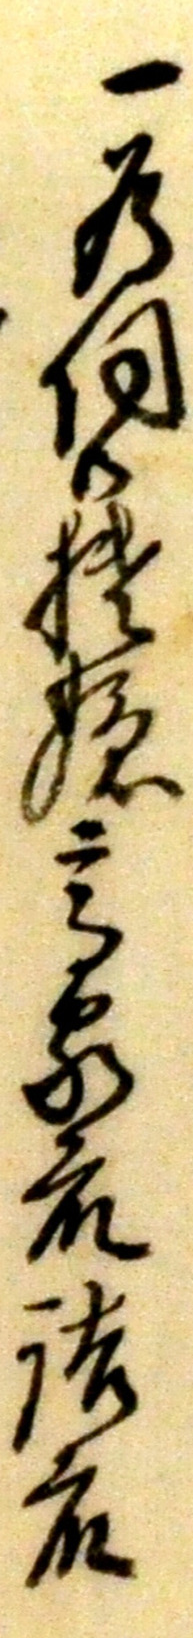一為伺御機嫌高家衆諸衆
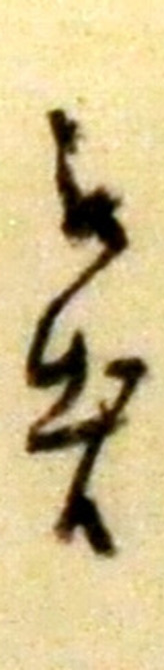被出候
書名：書抜
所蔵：伊那市立高遠町図書館・合同会社AMANE
